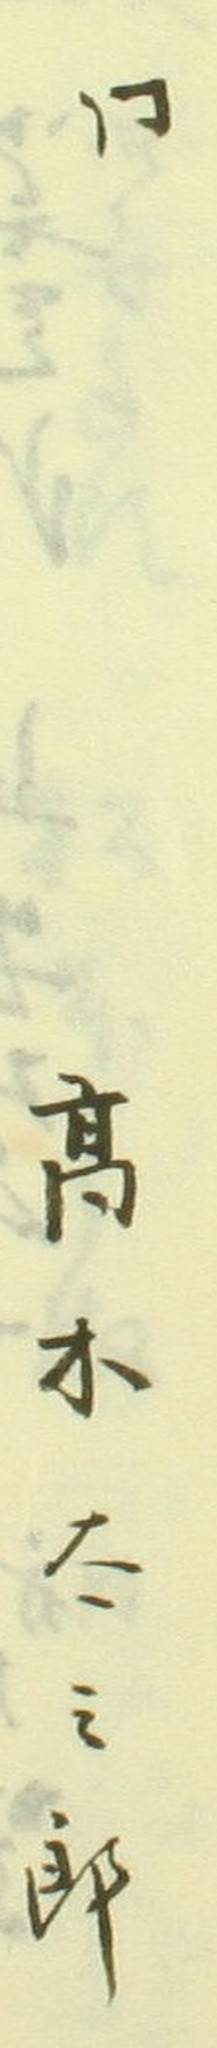同高木太三郎
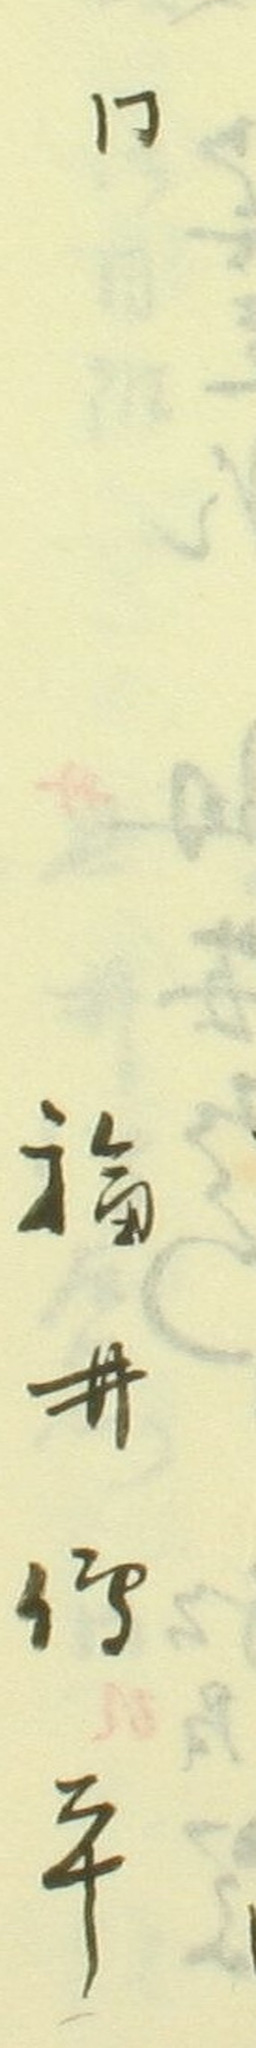同福井伝平
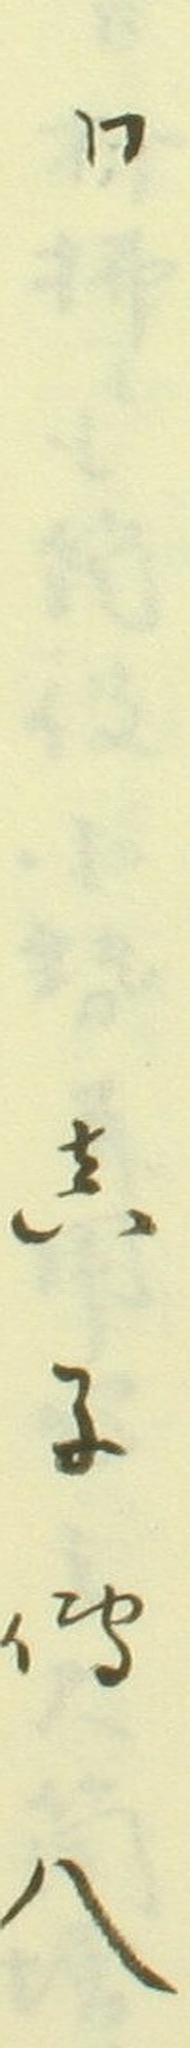同真子伝八
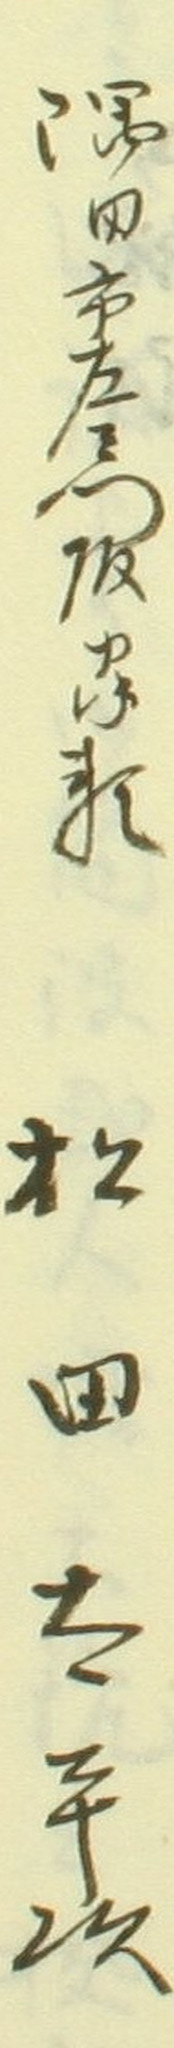隅田市左衛門阪？類松田太平次
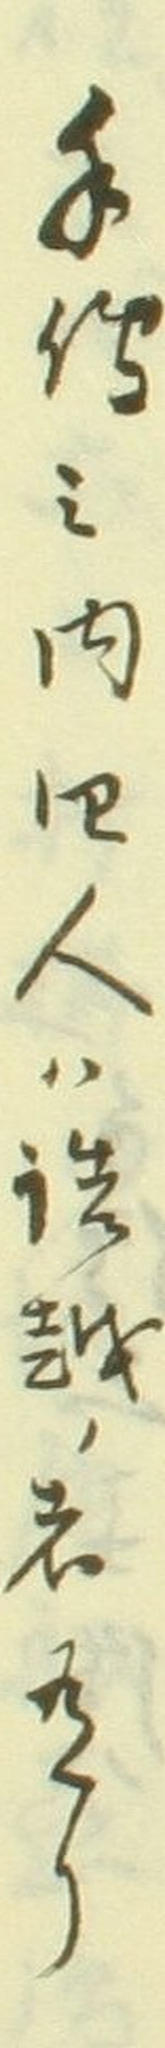手伝之内四人は詰越の者有り
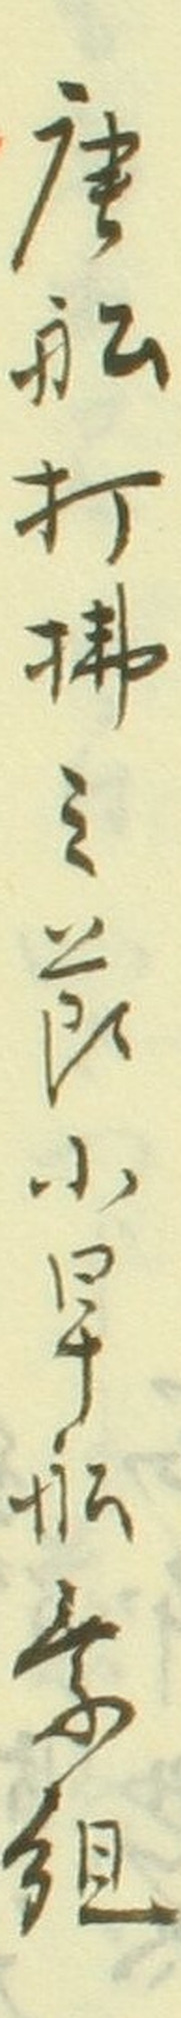唐船打払之節小早船乗組
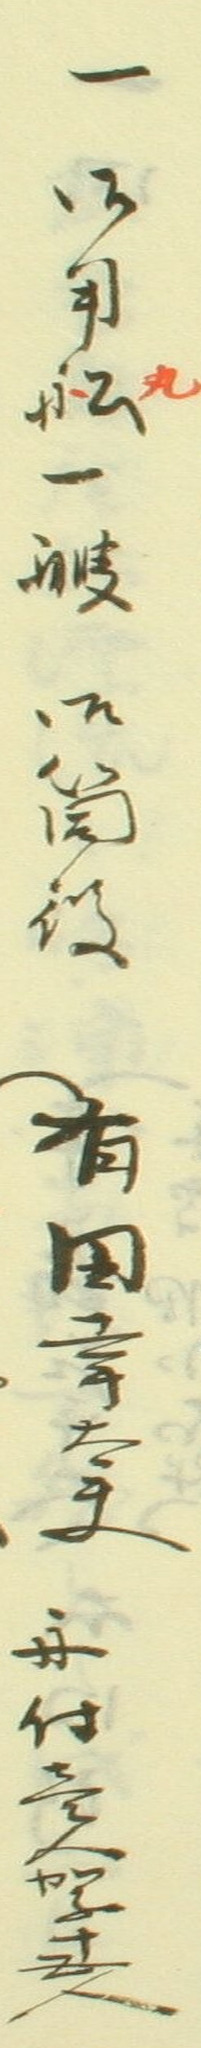一御用船一艘御筒役有田幸太夫舟付壱人駕？人
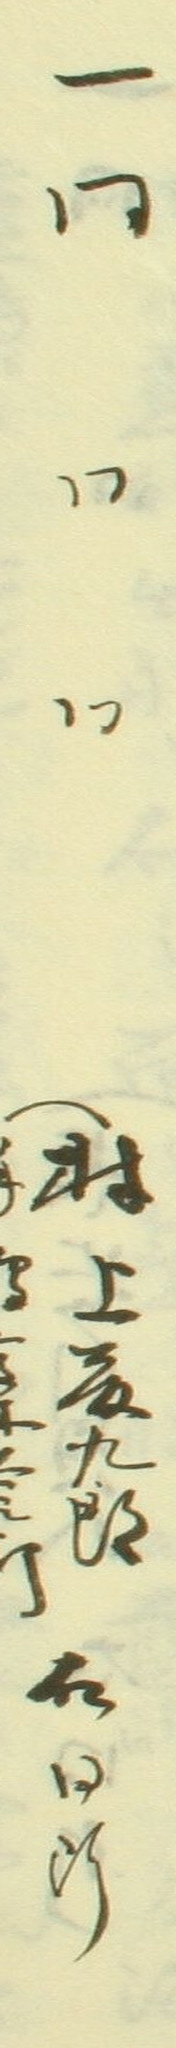一同同同村上籐九郎右同断
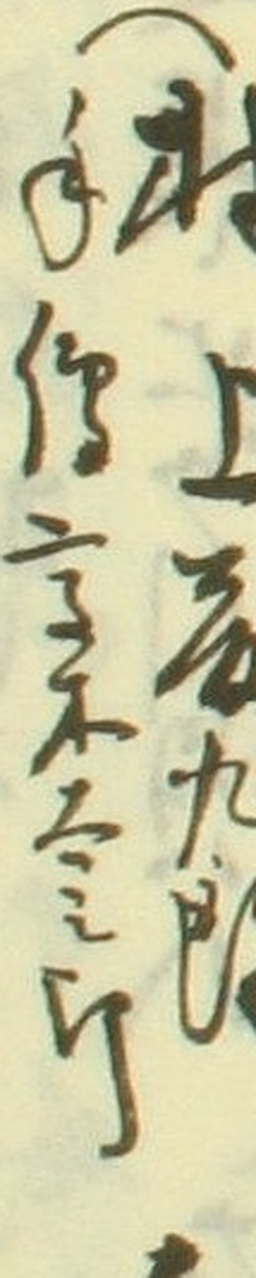手伝高木太三郎
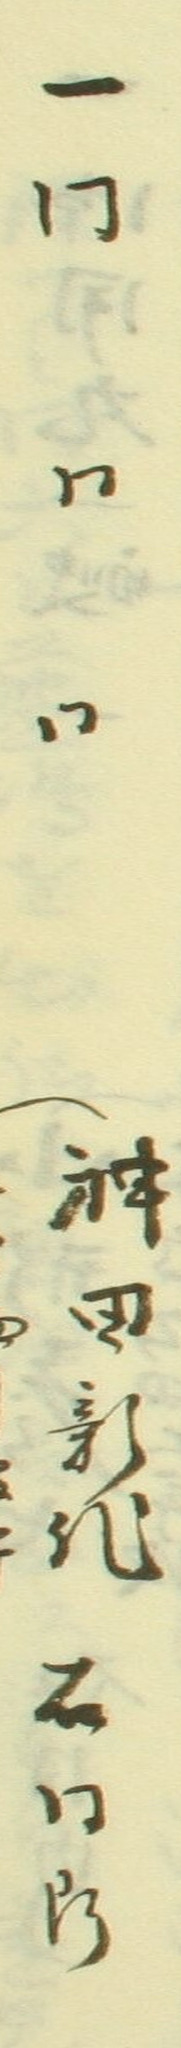一同同同神田新作右同断

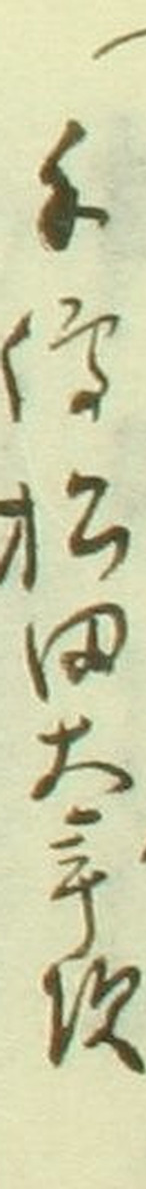手伝松田太平次
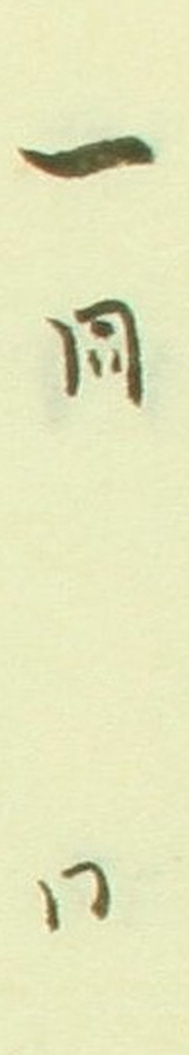一同同
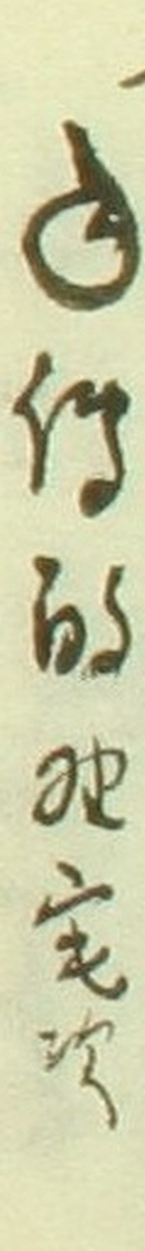手伝的野宅次
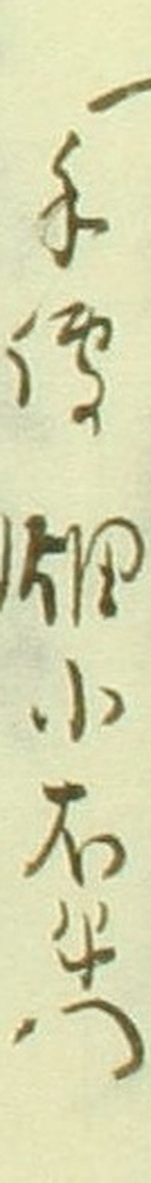手伝畑小右衛門
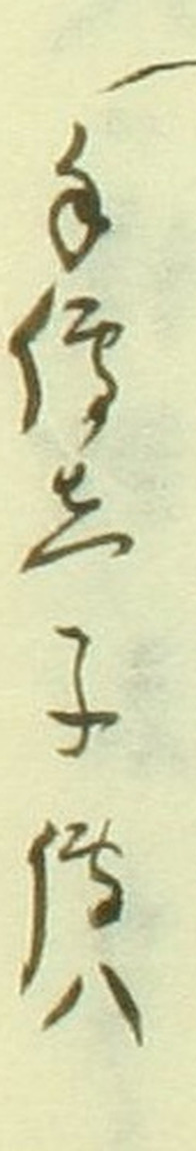手伝真子伝八
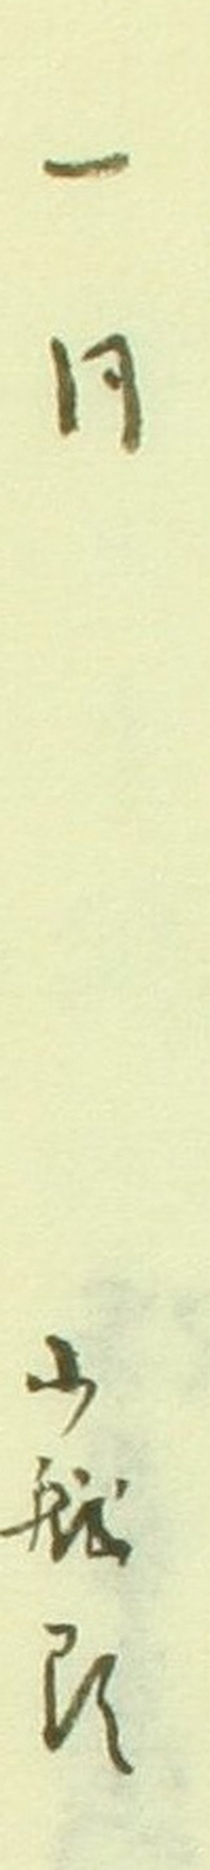一同小船頭
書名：唐船漂流記 三
